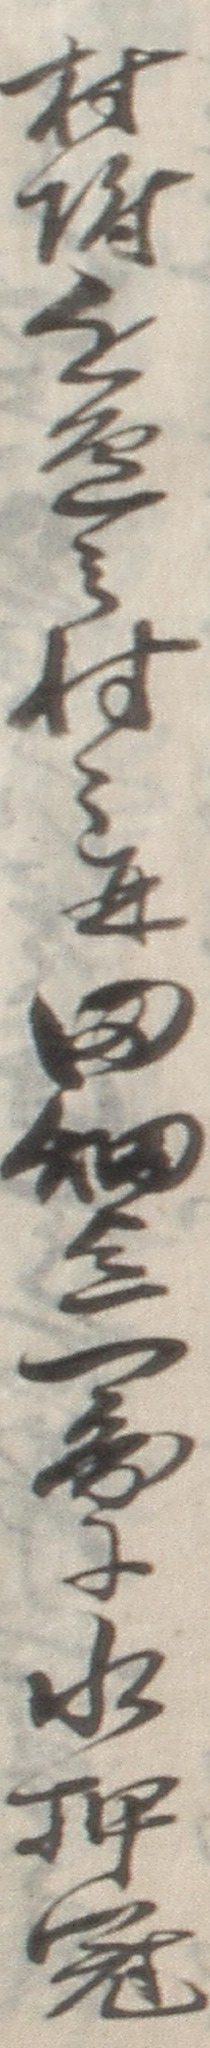村附近辺之村々并田畑迄一圓に水押冠
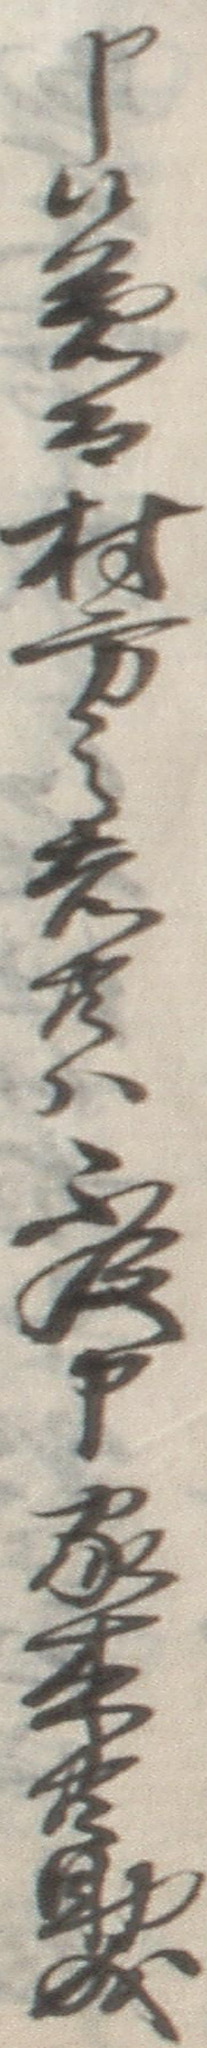申候兼而村方之者共ハ不及申家来共助成
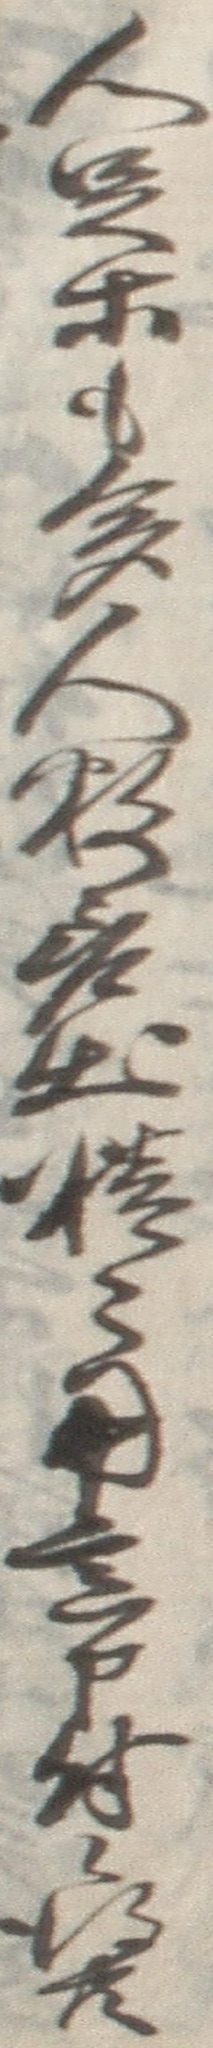人足等も多人数差出精々用意申付候得共
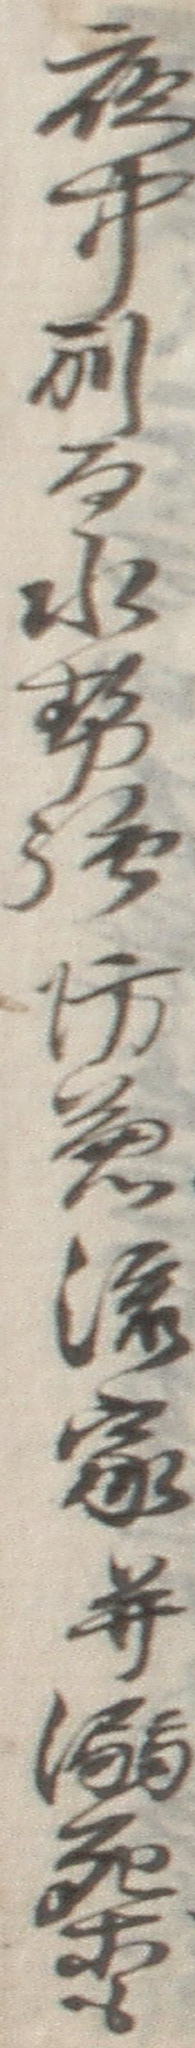夜中別而水勢強防兼流家并溺死等も

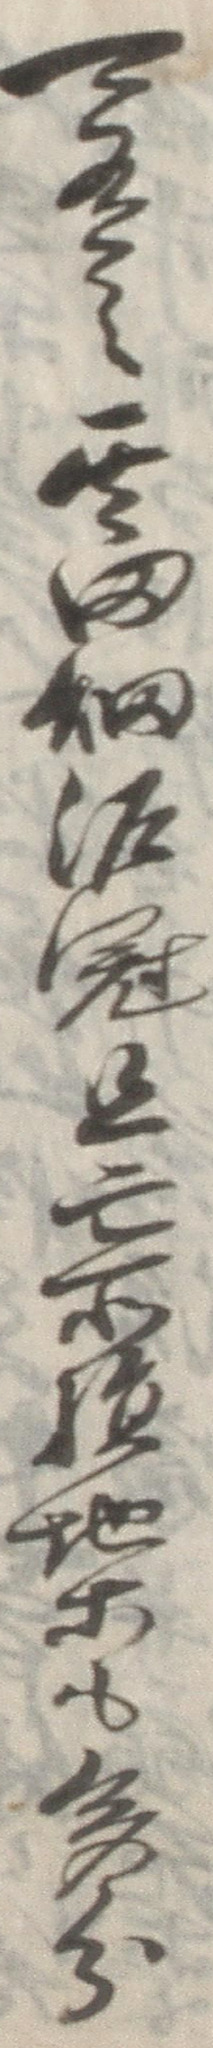可有之其田畑泥冠且亡所損地等も多分
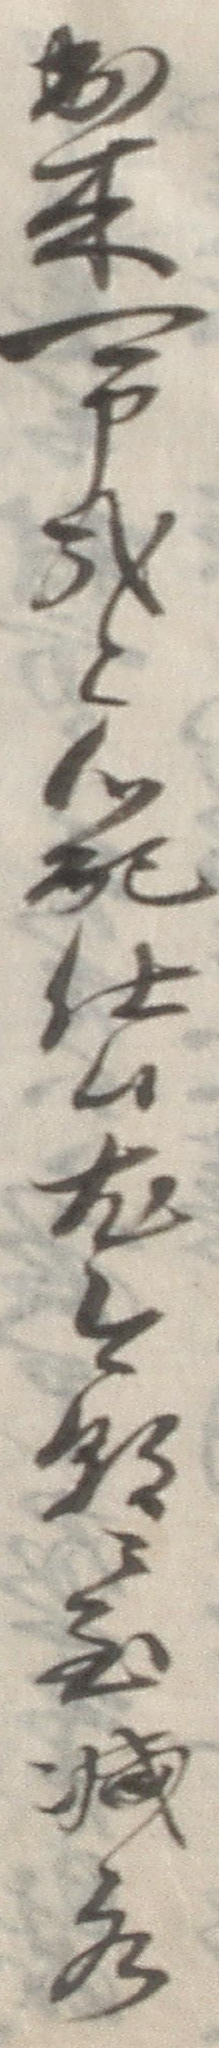出来可申哉と心配仕候尤今朝二至減水
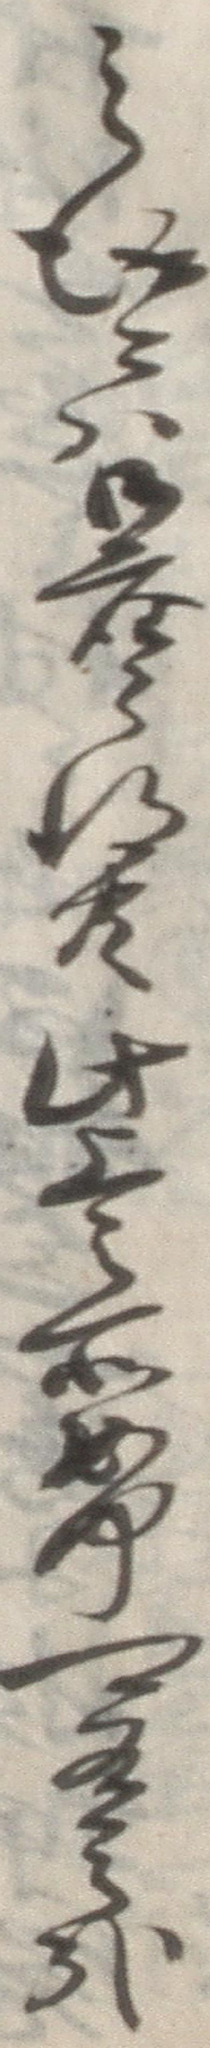之趣二ハ御座候得共此上之所如何可有之哉
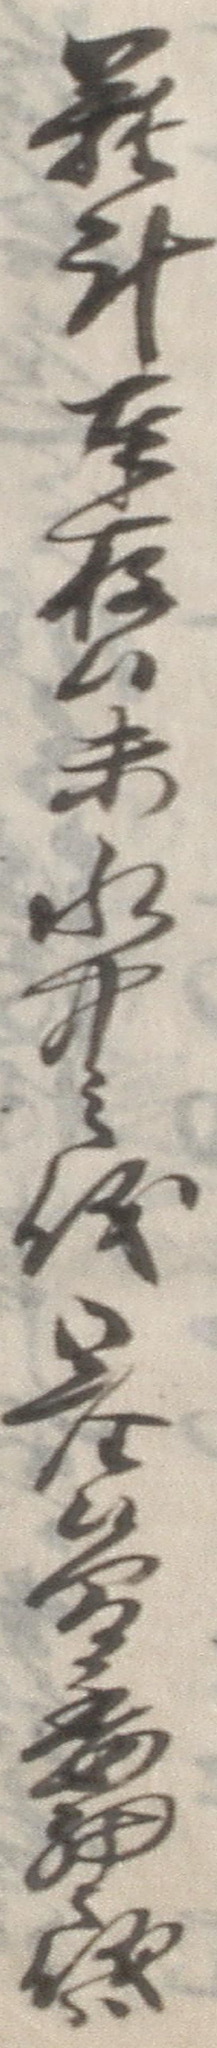難計奉存候未水中之儀御座候間委細之儀ハ
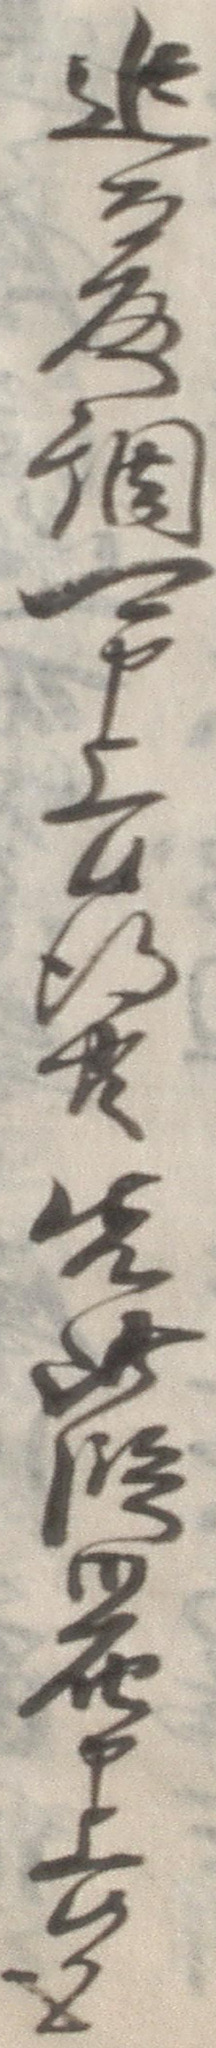追而取調可申上候得共先此段御届申上候以上
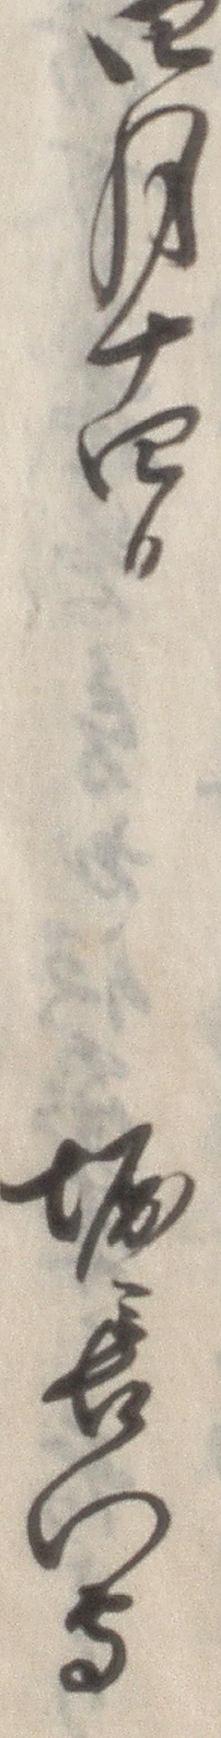四月十四日堀長門守
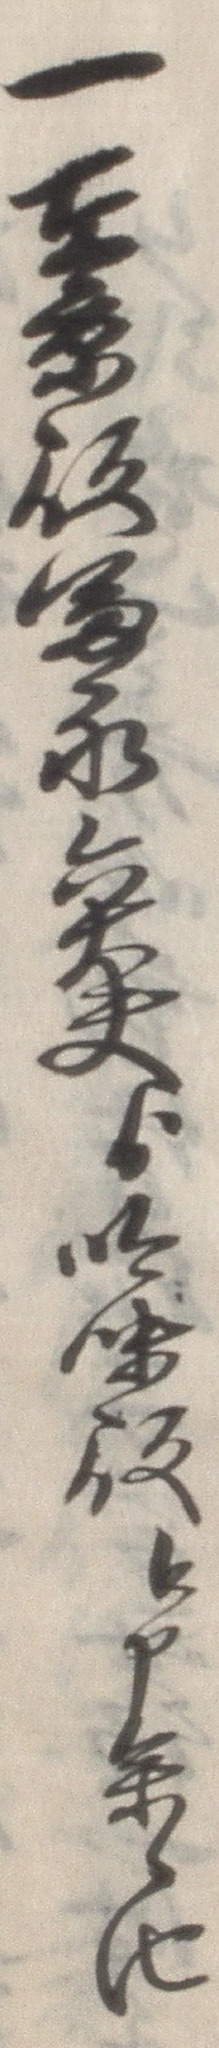一在亰役冨永六太夫ゟ吟味役江申参候由
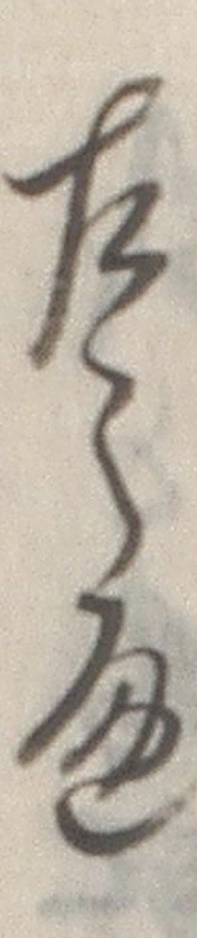左之通
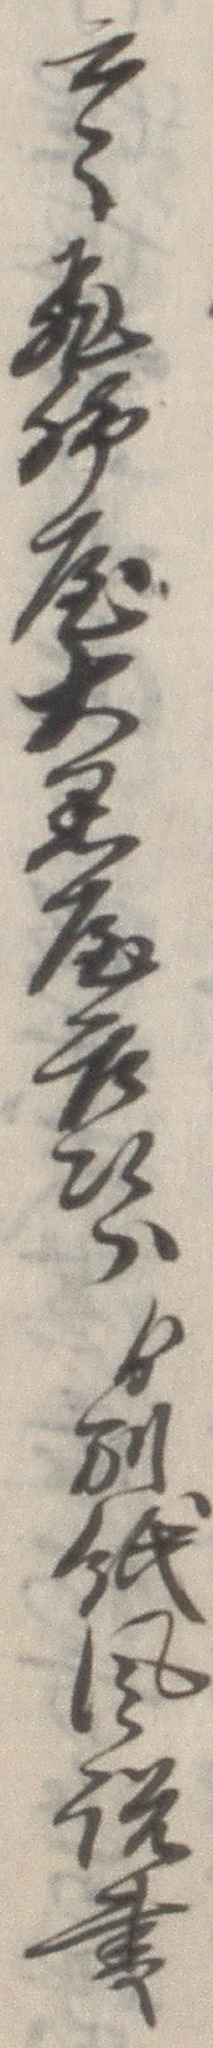尚々飛脚屋大黒屋庄治郎ゟ別紙風説書
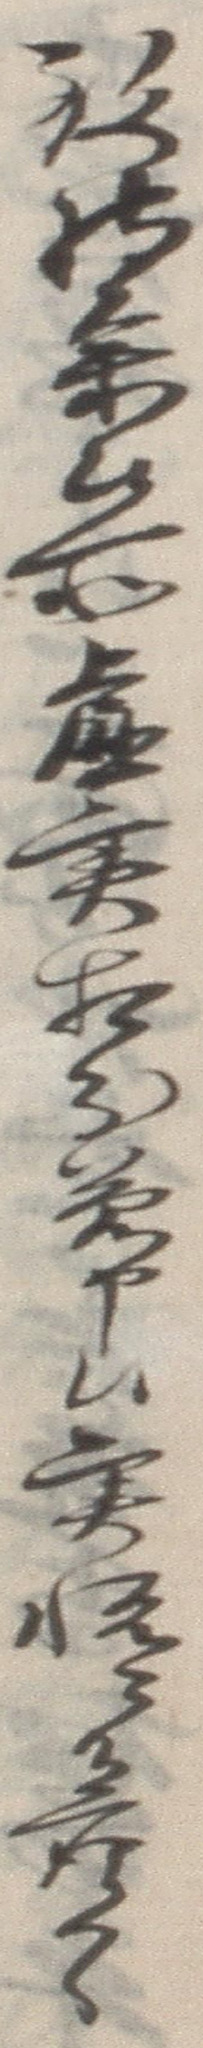致持参候所虚実相分兼申候実怪二御座候
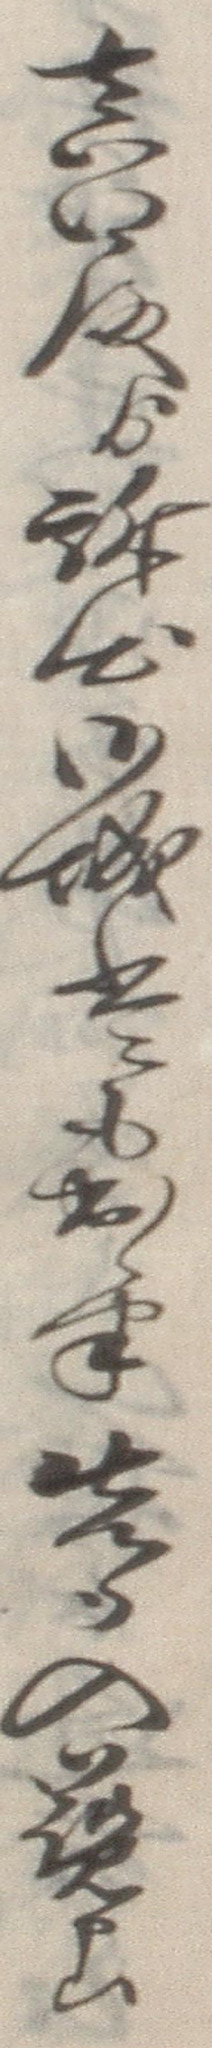真田殿ゟ訴出御城書二も出候筆先日入御覧申候
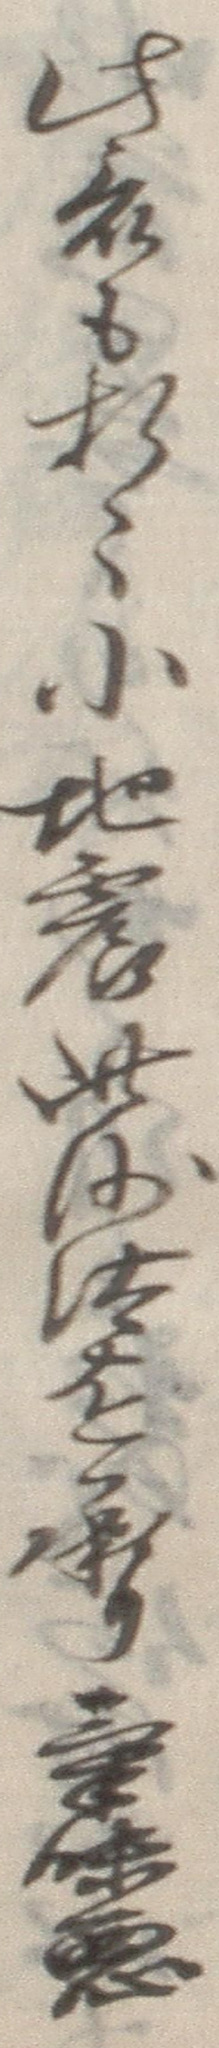此後も折々小地震此沙汰を承り筆味悪
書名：信州地震一件
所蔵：東京大学地震研究所図書室 Earthquake Research Institute Library, The University of Tokyo, JAPAN
